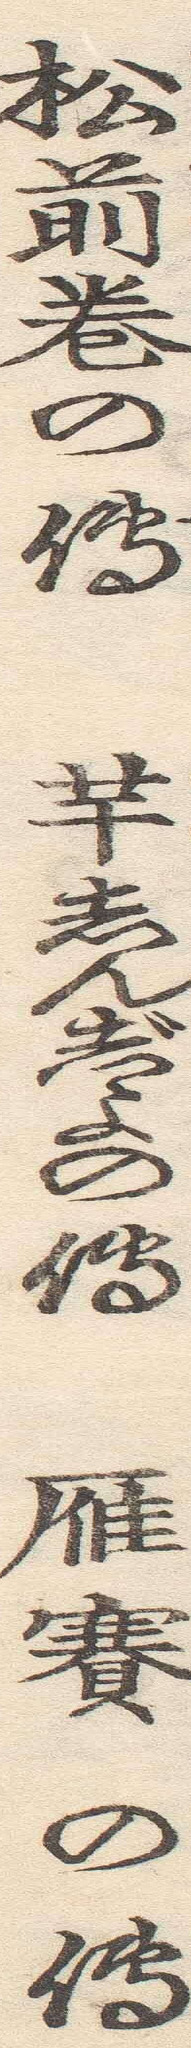松前巻の伝芋しんじよの伝雁賽の伝
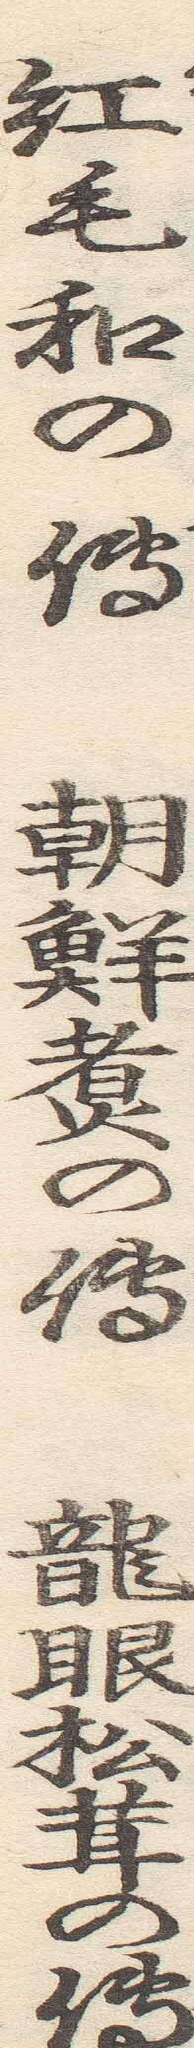紅毛和の伝朝鮮煮の伝龍眼松茸の伝
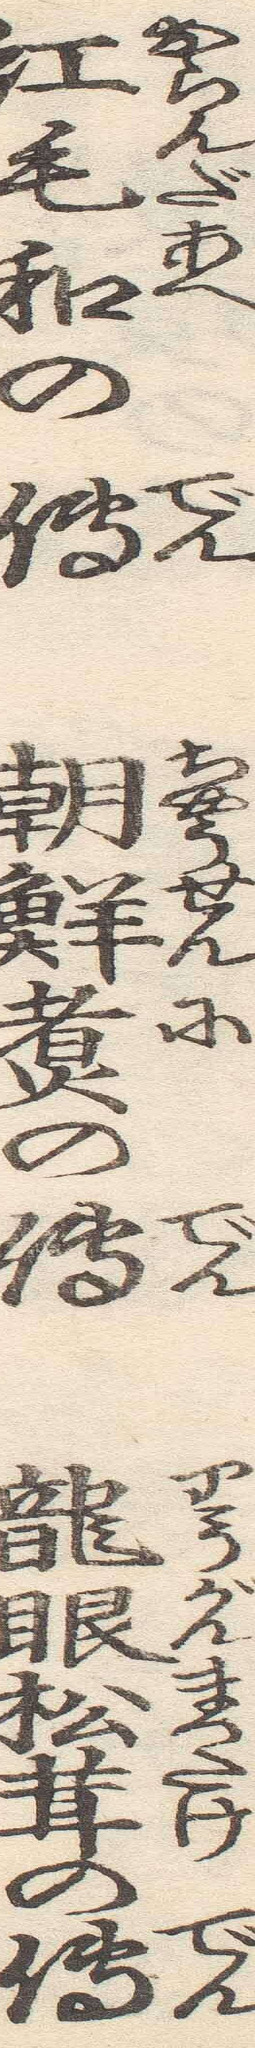紅毛和の伝朝鮮煮の伝龍眼松茸の伝
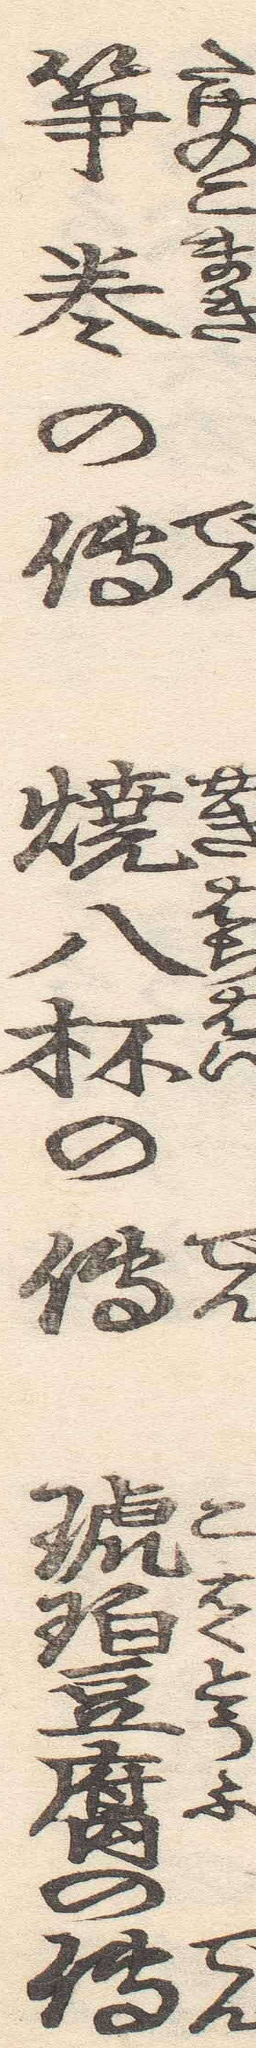笋巻の伝焼八杯の伝琥珀豆腐の伝
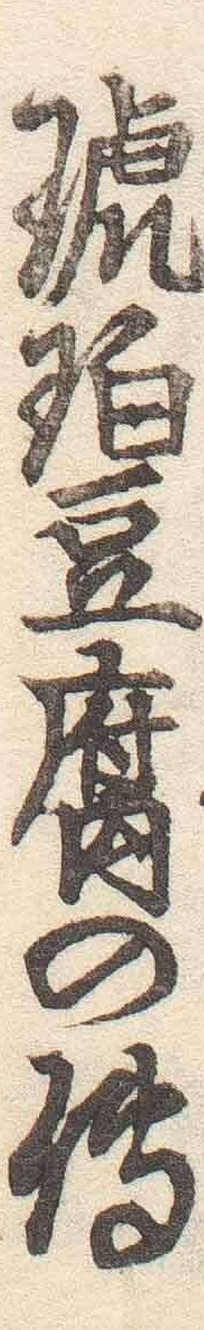玉章豆腐の伝
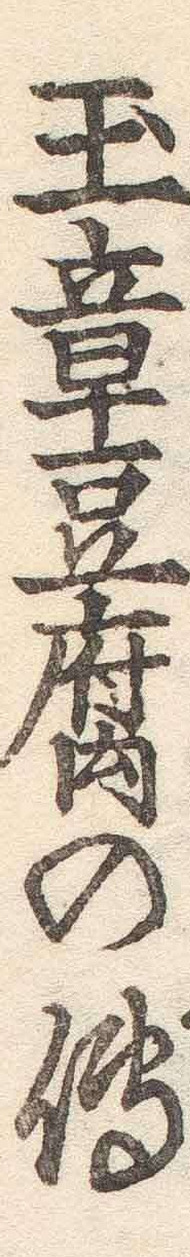玉章豆腐の伝
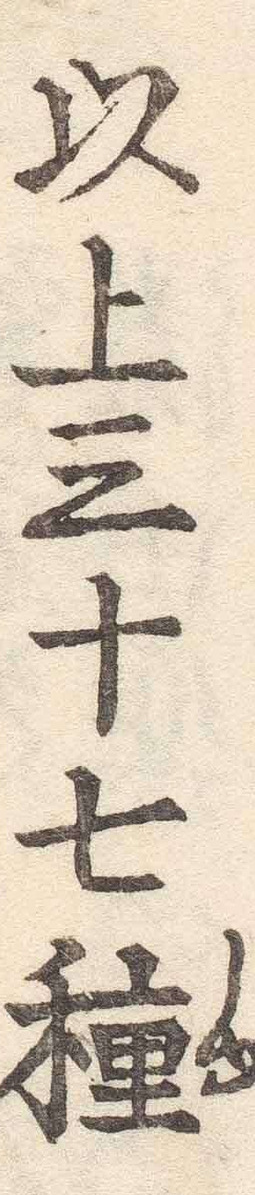以上三十七種
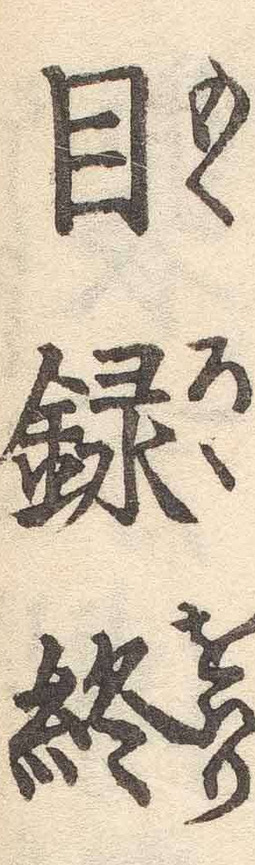目録終
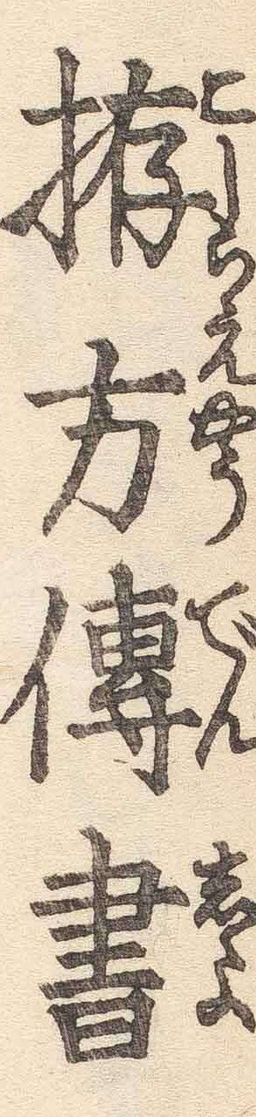拵方伝書
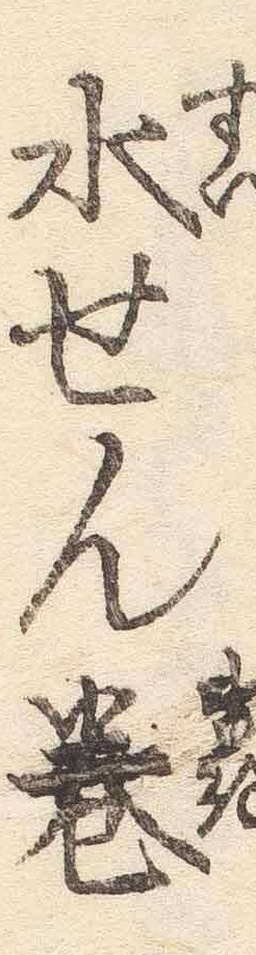水せん巻
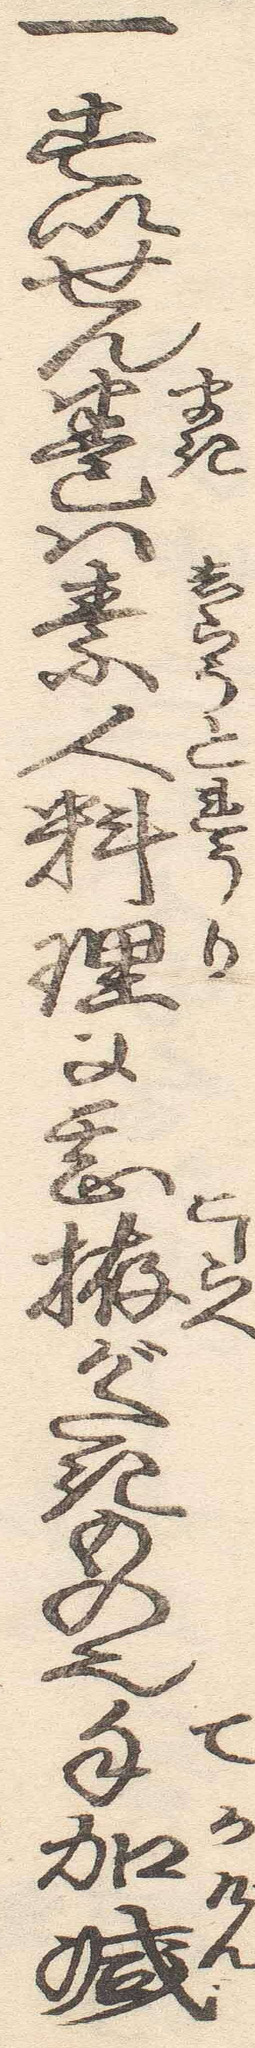一すいせん巻は素人料理に甚拵がたきもの也手加減
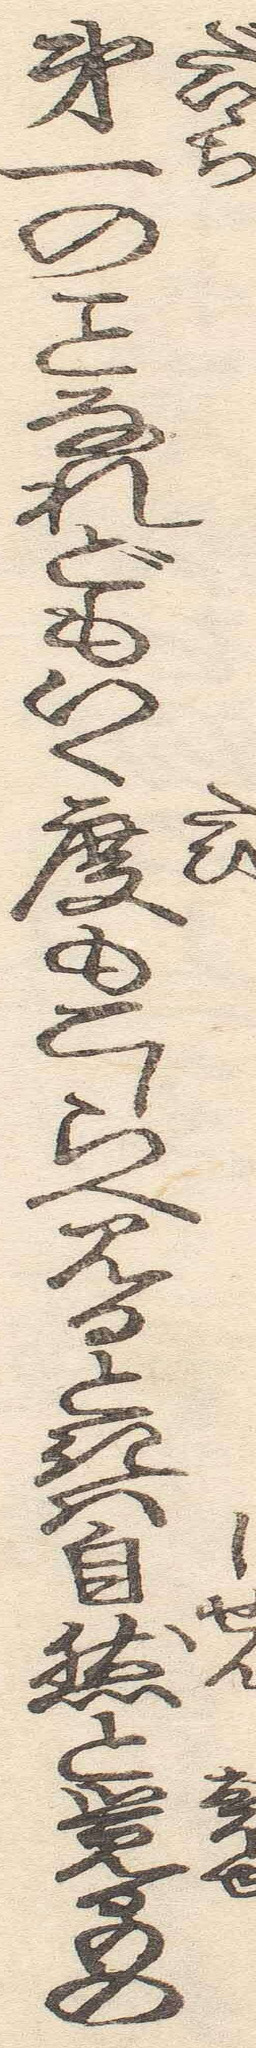第一のことなれどもいく度もこしらへ見るときは自然と覚るもの
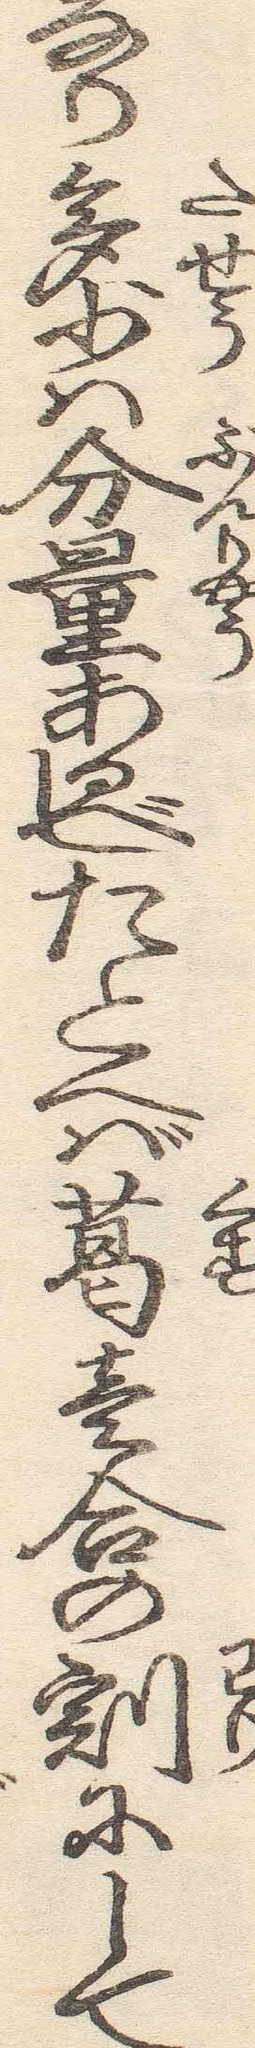なり多少は分量あるべしたとへば葛壱合の割にして
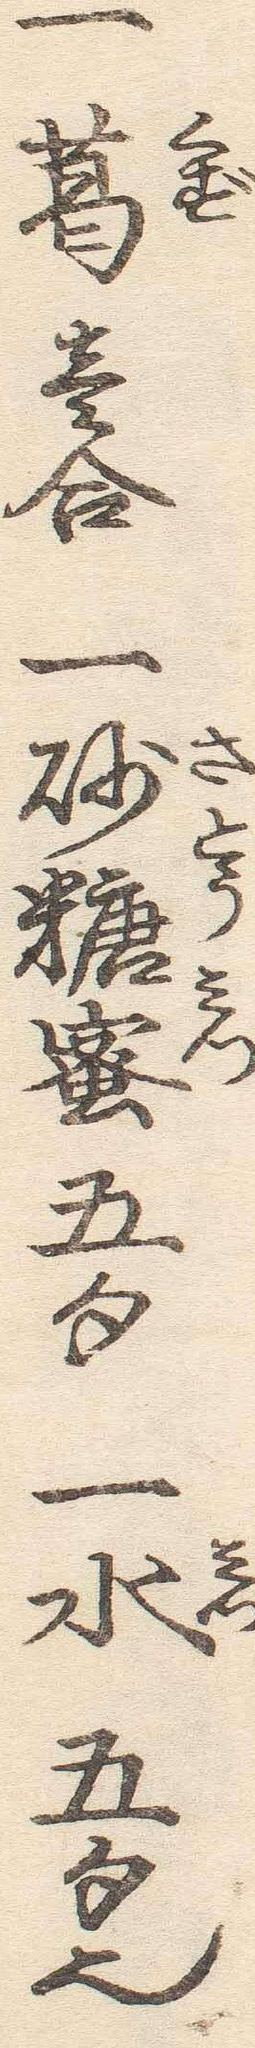一葛壱合一砂糖蜜五勺一水五勺也
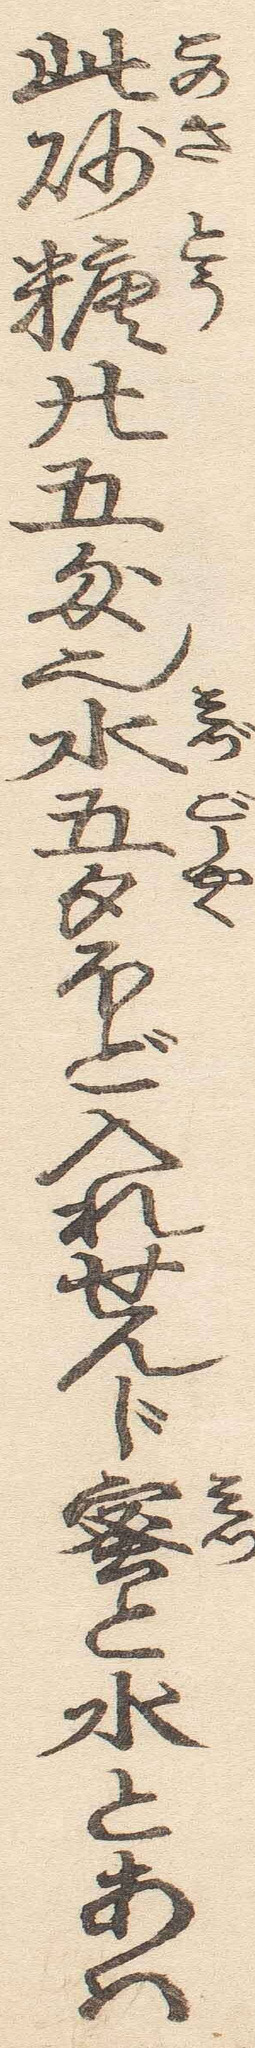此砂糖廿五匁也水五勺ほど入れせんじ蜜と水とあは
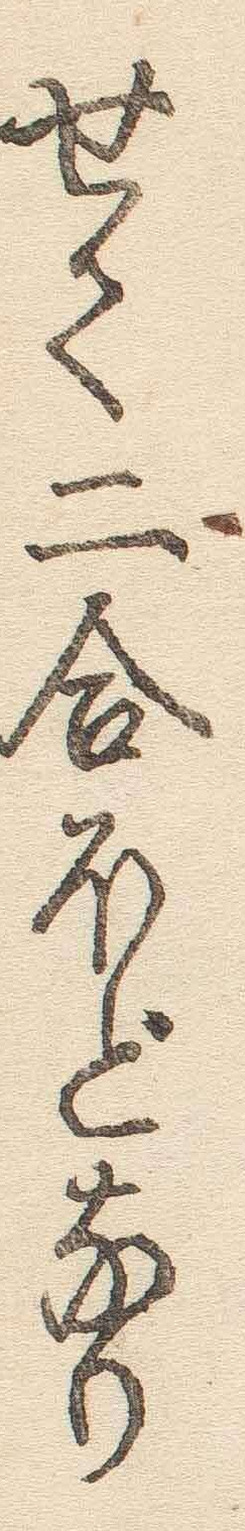せて二合ほどなり
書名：料理通
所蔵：東京学芸大学附属図書館 国文学研究資料館
